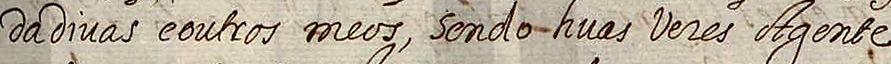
dadivas e outros meos, sendo huas vezes Agente
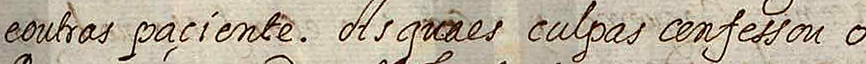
e outras paçiente. As quaes culpas confessou o
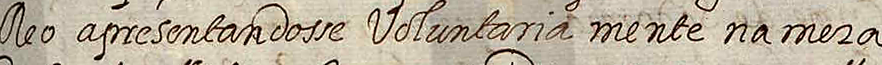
Reo apresentandosse voluntariamente na meza
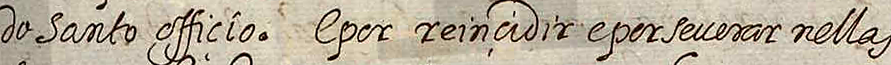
do Santo Officio. E por reincidir e perseverar nellas
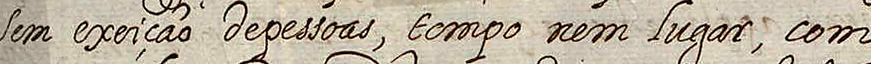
sem exceição de pessoas, tempo nem lugar; com
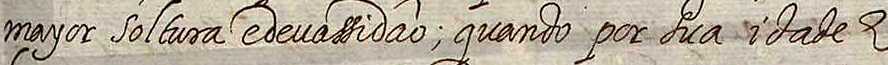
mayor soltura e devassidão; quando por sua idade e
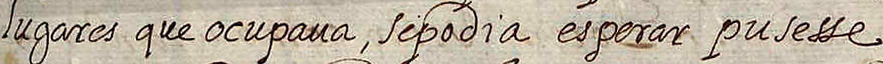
lugares que ocupava, se podia esperar pusesse
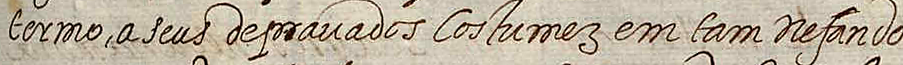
termo a seos depravados costumez em tam nefando
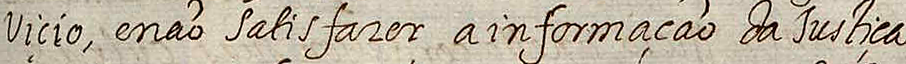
Vicio, e não satisfazer a informação da Justiça
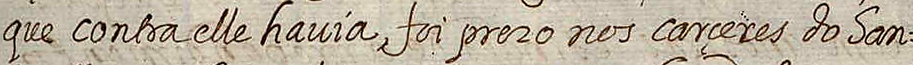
que contra elle havia, foi prezo nos carceres do San
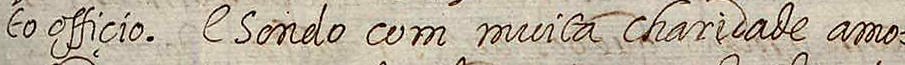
to officio. E sendo com muita charidade amo
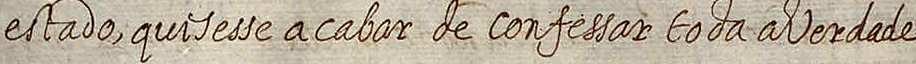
estado, quisesse acabar de confessar toda a Verdade
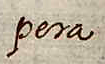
pera
